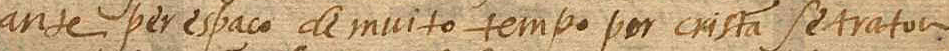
ante per espaço de muito tempo por cristā se tratou
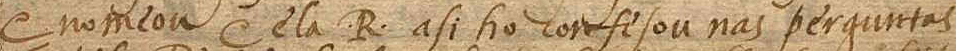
e nomeou e ela .R. asi ho confesou nas perguntas
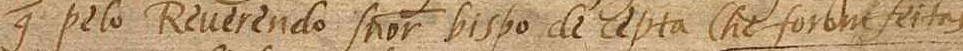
q̄ pelo Reuerendo snōr bispo de cepta lhe forom feitas
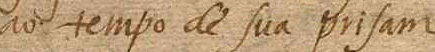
ao tempo de sua prisam
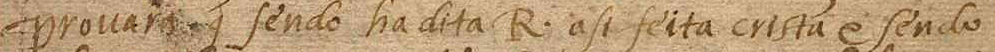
Prouara q̄ sendo ha dita R. asi feita cristā e sendo
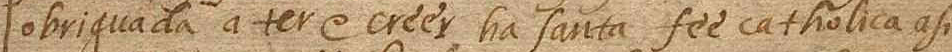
obriguada a ter e creer ha santa fee catholica asi
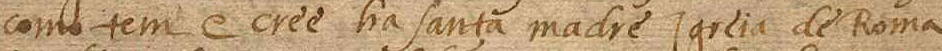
como tem e cree ha santa madre Jgreia de Roma
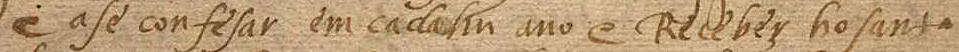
e a se confesar em cada hū ano e Receber ho santo
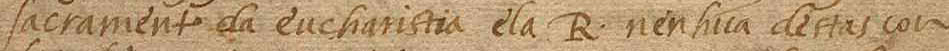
sacramento da eucharistia ela R. nenhūa destas cou
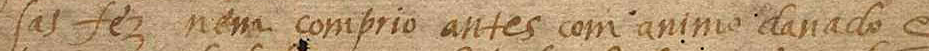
sas fez nem comprio antes com animo danado e
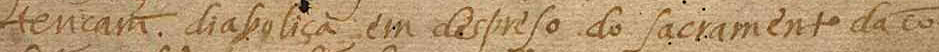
tençam diabolica em despreso do sacramento da c̄o
